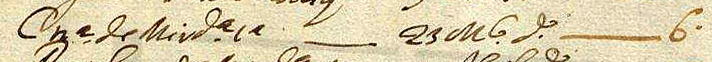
Cn.a de Mird.a 1a. - 23 M.co d.o - 6.
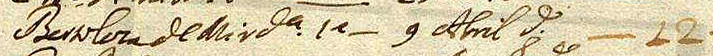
Bertoloza de Mird.a 1a. - 9 Abril d.o - 12.
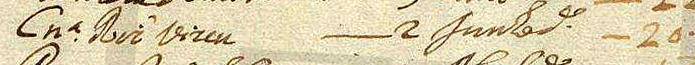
Cna. Roiz̄ vizeu - 2 Junho d.o - 20.
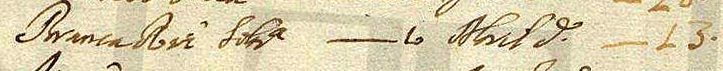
Branca Roiz̄ soltr.a - 10 Abril d.o - 13.
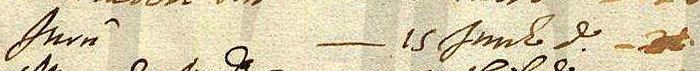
Jurn̄ - 15 Junho d.o
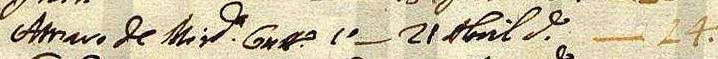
Amaro de Mird.a Coutt.o 1º - 21 Abril d.o - 24.
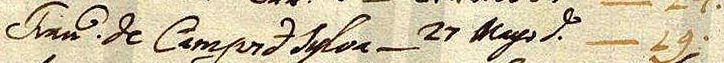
Franc.o de Campos d̄ Sylva - 27 Mayo d.o - 29.
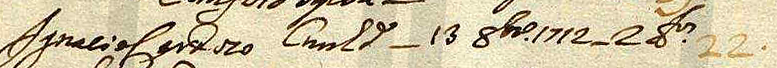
Jgnacio Cardozo Cunhd.o J - 13 8bro. 1712 - 2 d̄os. 22.
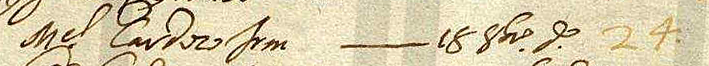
M.el Cardozo Jrm - 18 8.bro d.o 24.
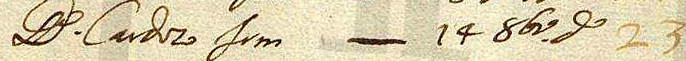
D.o Cardozo Jrm - 14 8bro. d.o - 23
